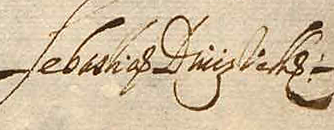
Sebastiaõ Diniz Velho
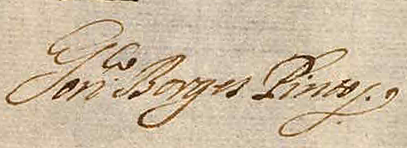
Gon.co Borges Pinto
